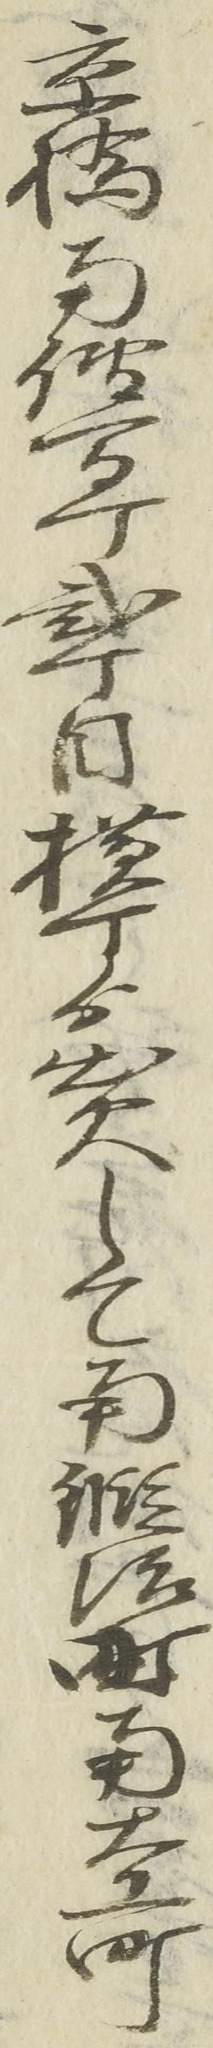京橋南傳馬丁弐丁目横丁ゟ出火して南鍛治町南大工町
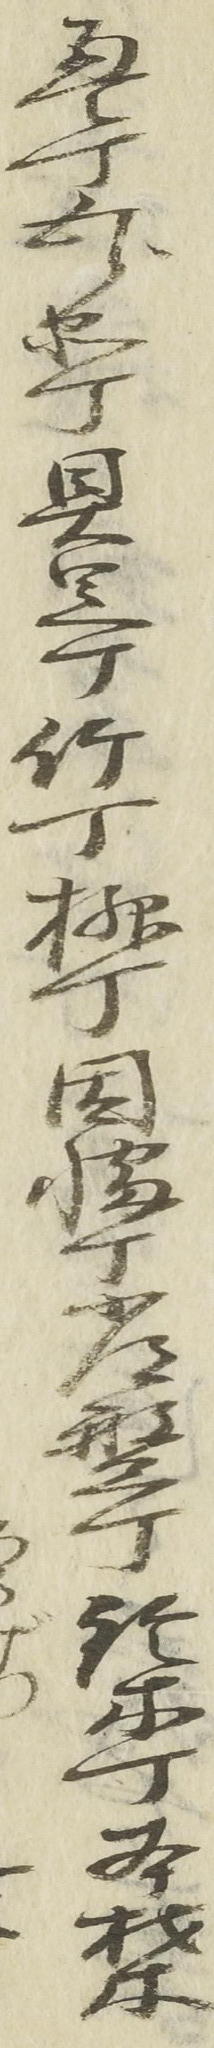畳丁五郎兵衛丁具足丁竹丁柳丁因幡丁常盤丁鈴木丁本材木
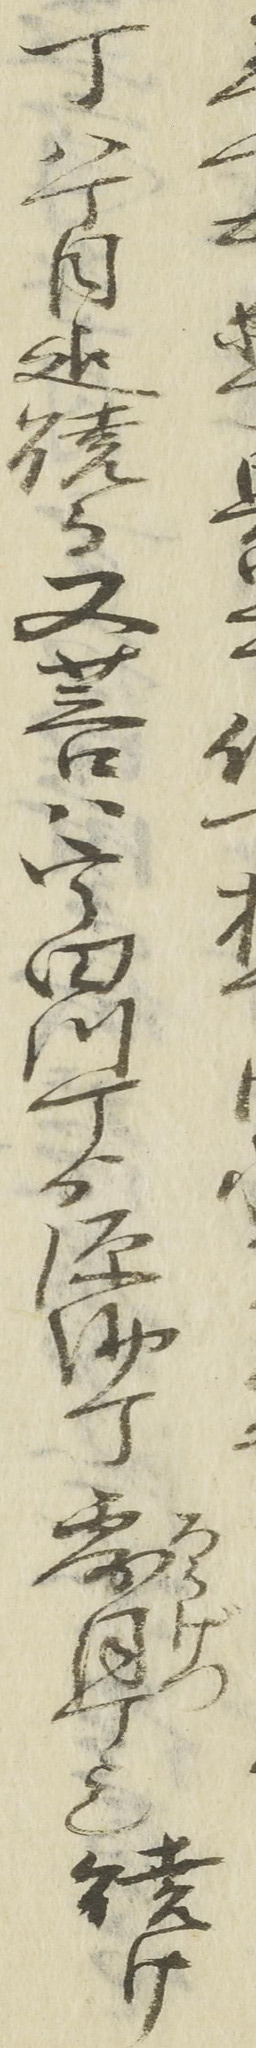丁八丁目迄焼る又芝口ハ宇田川丁ゟ源助丁露月丁も焼け
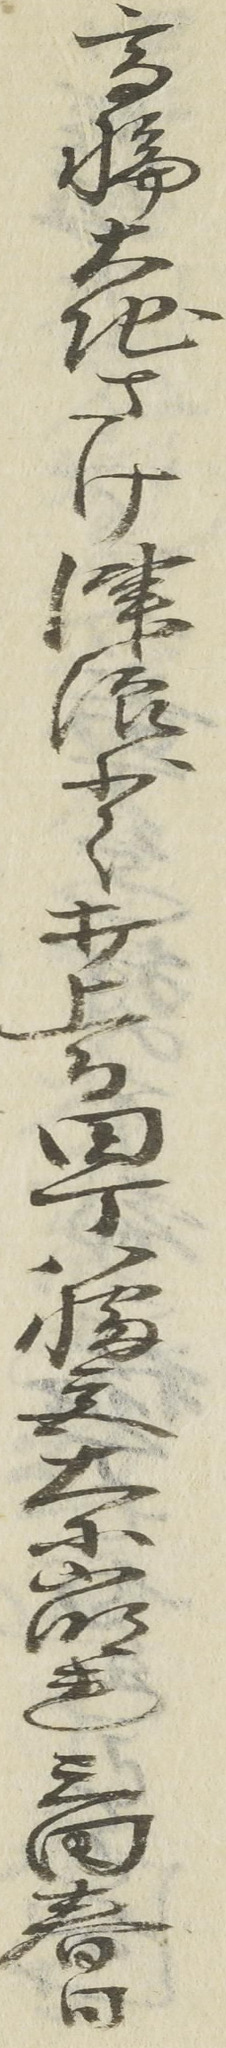高輪大地さけ津浪少し打上る田丁八幡宮大に崩れ三田春日
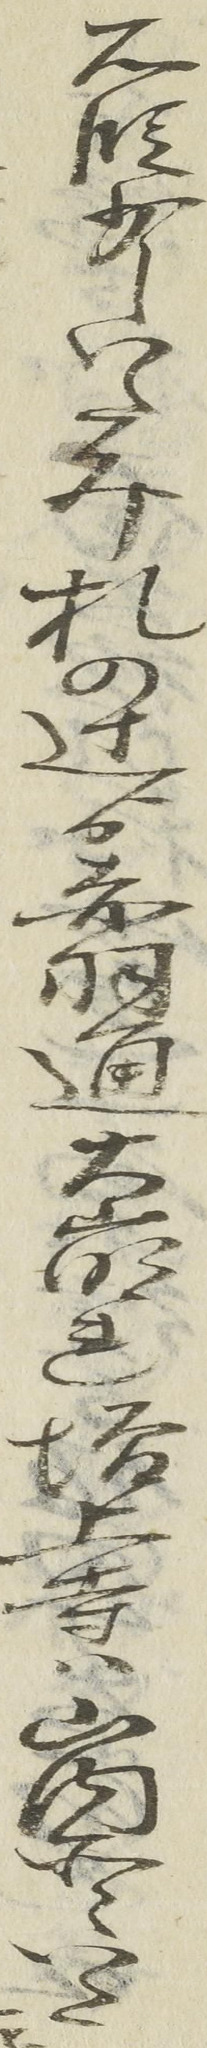石段少しいたみ札の辻ゟ赤羽通大崩れ増上寺ハ山内所〻いたミ
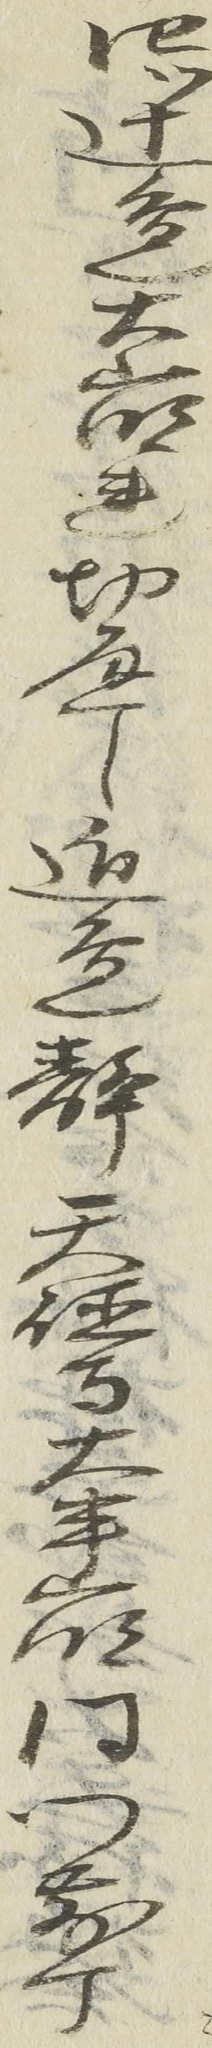四ツ辻辺大崩れ切通し近辺静天徳寺大半崩同門前丁
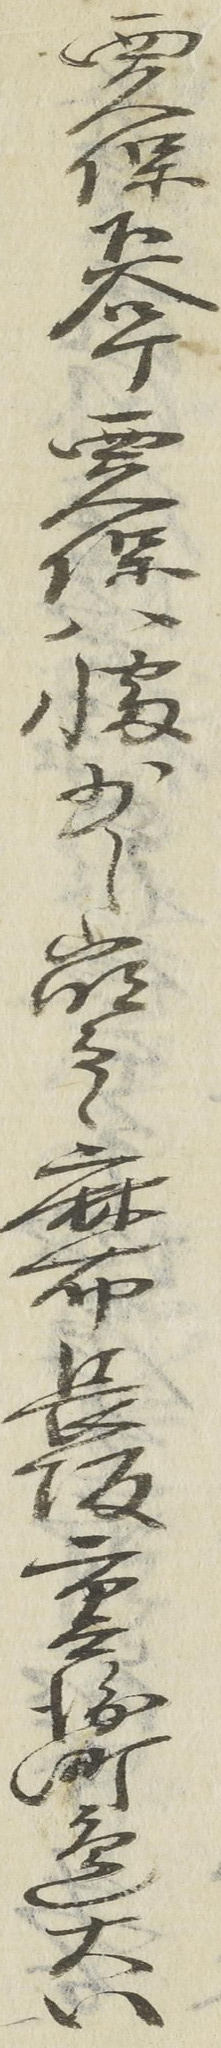西久保下谷丁西久保八幡少し崩るゝ麻布長坂市兵衛町辺大い
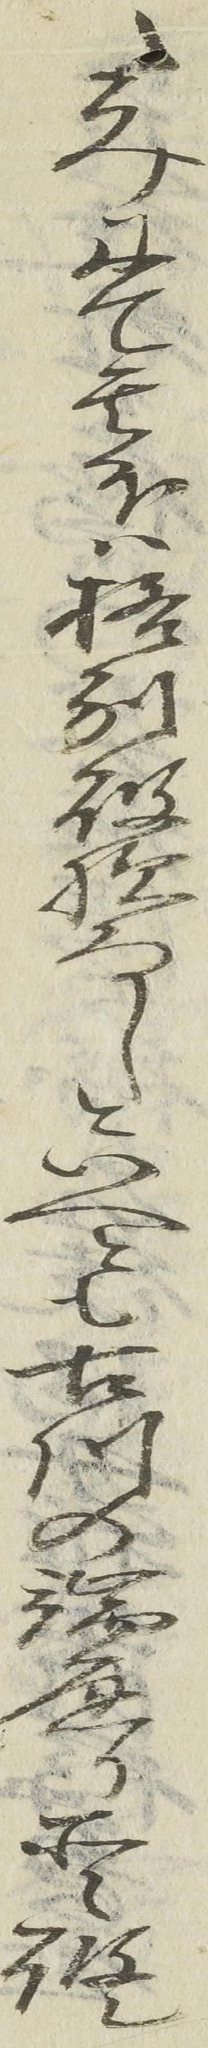たみにて其外ハ格別破損なしといへとも古川の端通り所〻破レ
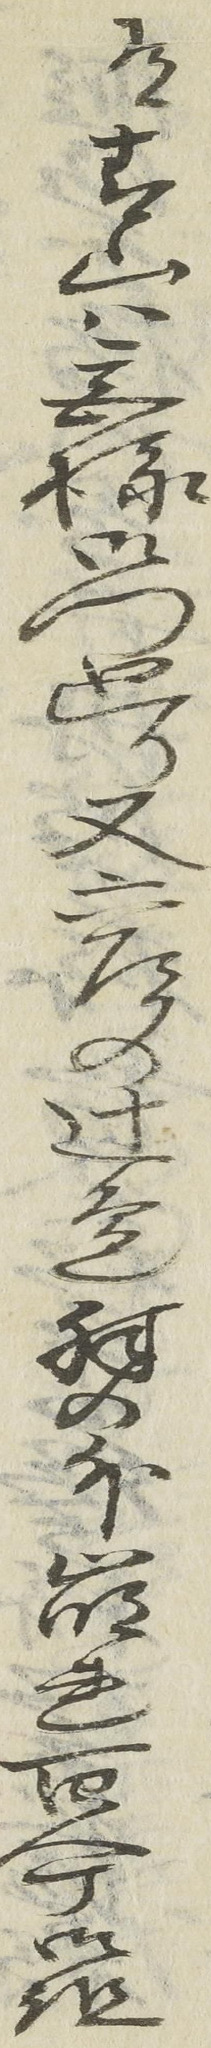有青山ハ宮様御門廻りまた六道の辻辺殊の外崩れ百人丁御組
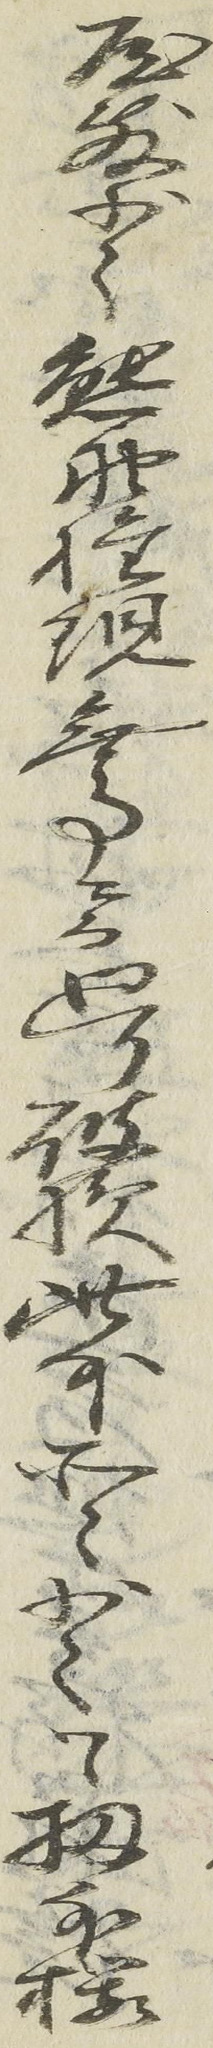屋敷少し熊野権現無事ニ而廻り破損此外所〻少しツヽ扨外桜
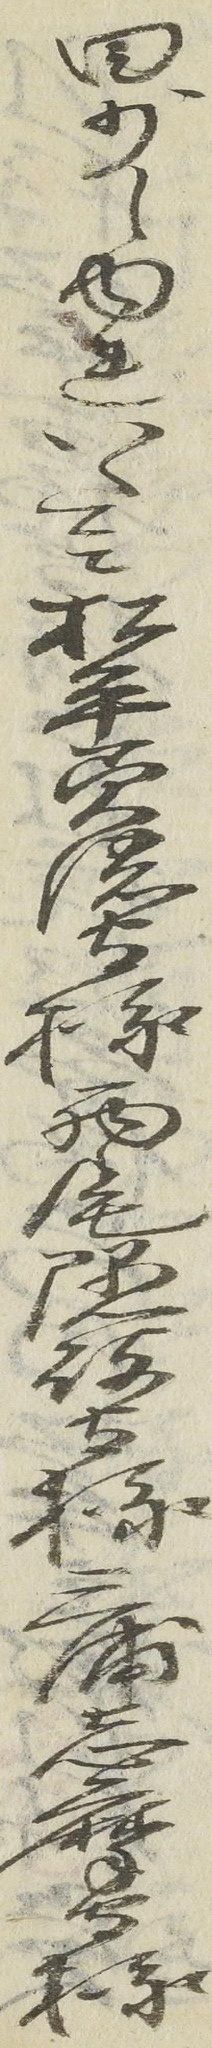田少しゆれいたミ松平美濃守様西尾隠岐守様三浦志摩守様
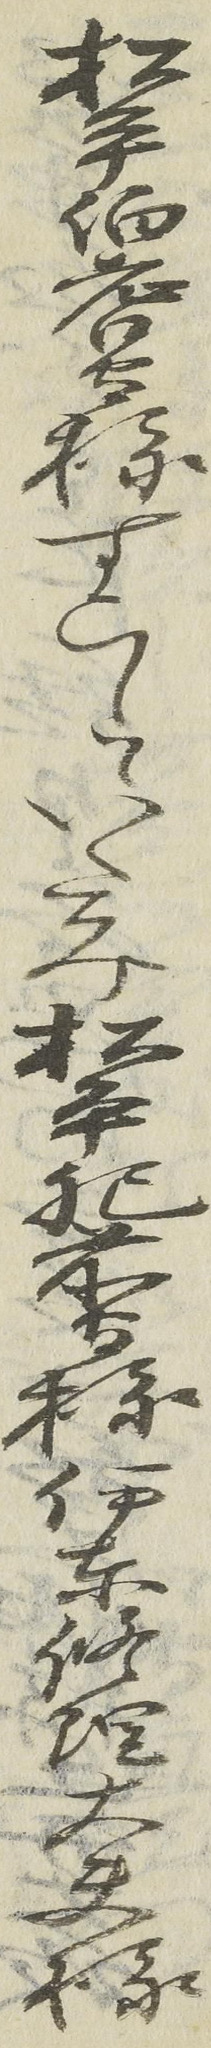松平伯耆守様すこしツヽいたみ松平肥前守様伊東修理大夫様
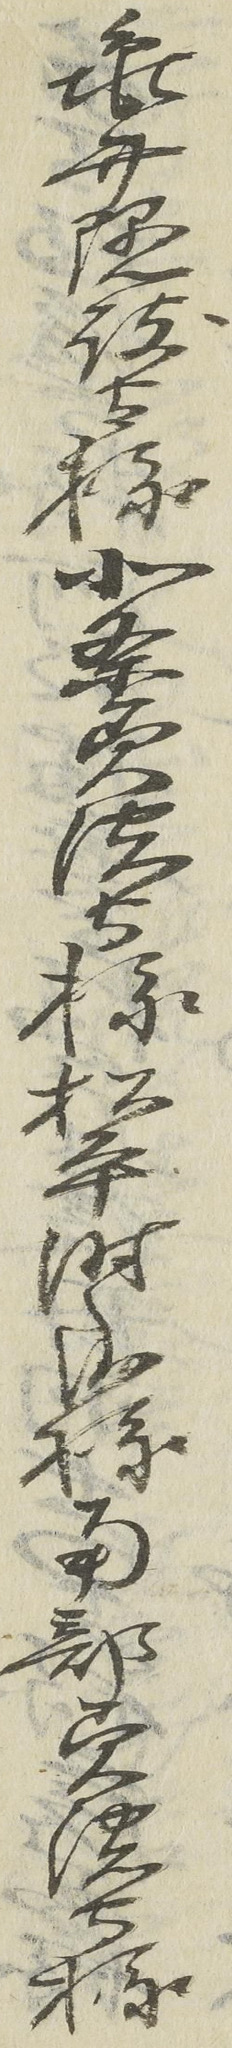亀井隠岐守様北条美濃守様松平時之助様南部美濃守様

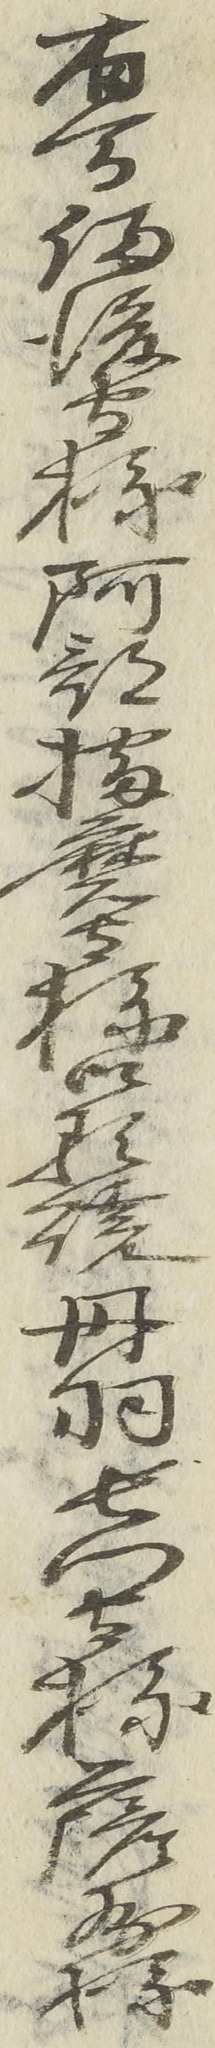有馬備後守様阿部播磨守様御類焼丹羽長門守様薩州様
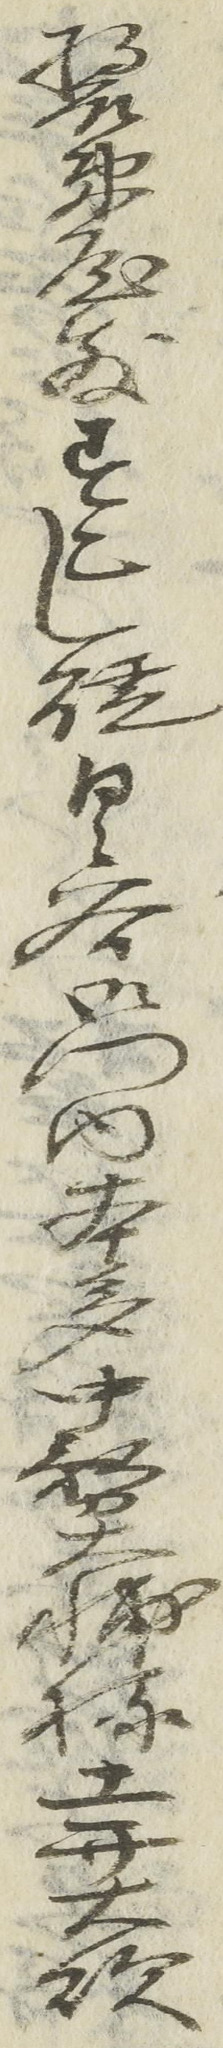装束屋敷すこし焼日々谷御門内本多中務大輔様土井大炊
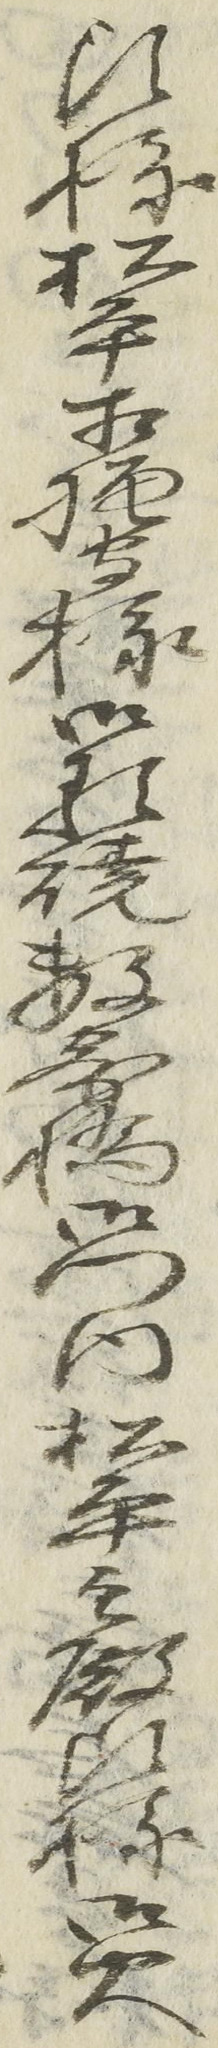頭様松平相模守様御類焼数寄橋御門内松平主殿頭様御火
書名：安政乙卯江戸大地震筆記　安政丙辰八月大阪大雷雨之記追加　安政三辰年七月松前辺大地震并八月大風雨記録
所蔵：東京大学地震研究所図書室 Earthquake Research Institute Library, The University of Tokyo, JAPAN
